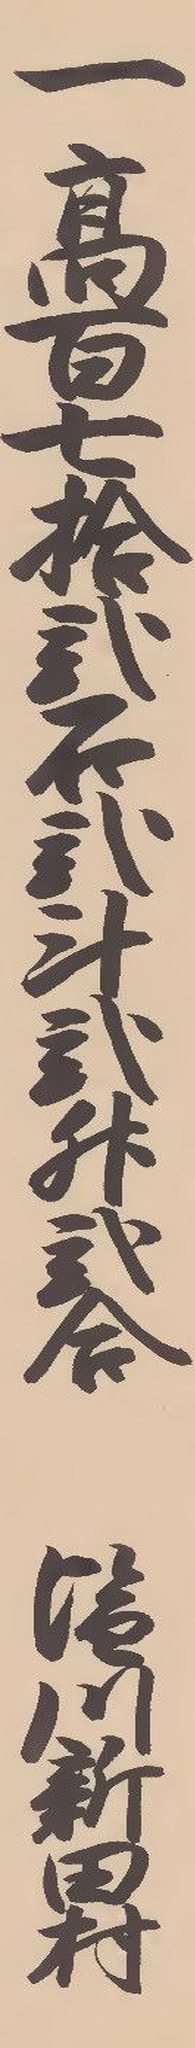一高百七拾弐石弐斗弐升弐合塩川新田村
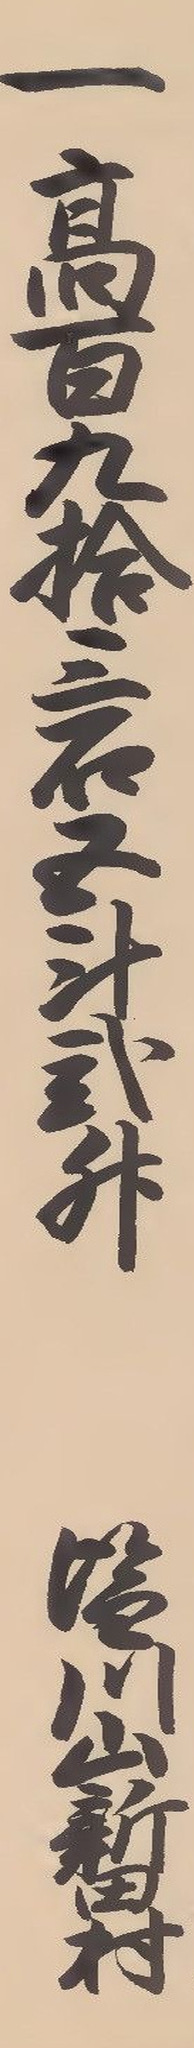一高百九拾三石五斗弐升塩川山新田村
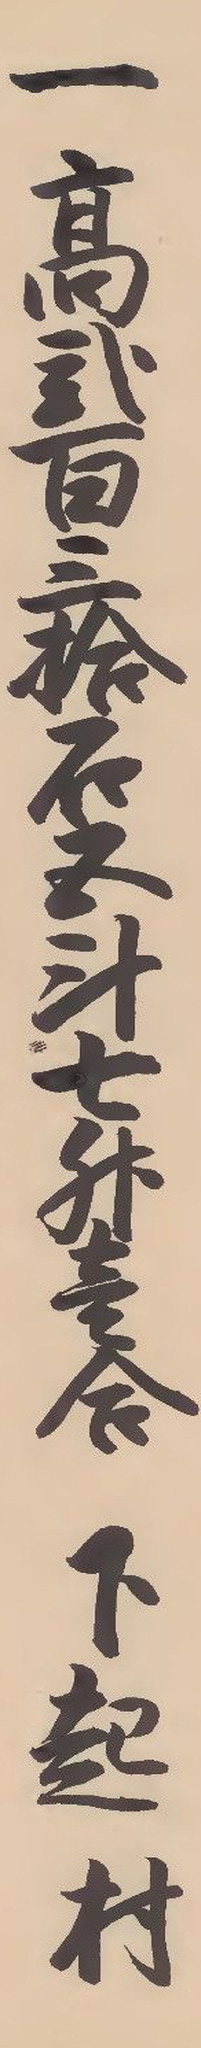一高弐百三拾石五斗七升壱合下起村
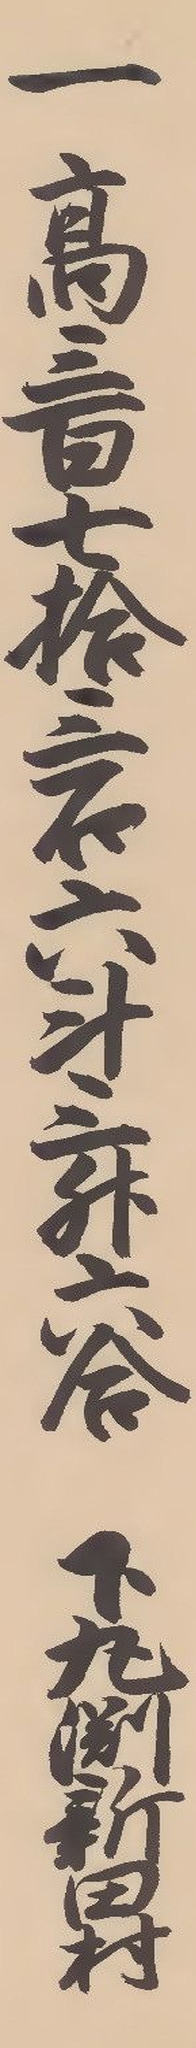一高三百七拾三石六斗三升六合下丸渕新田村
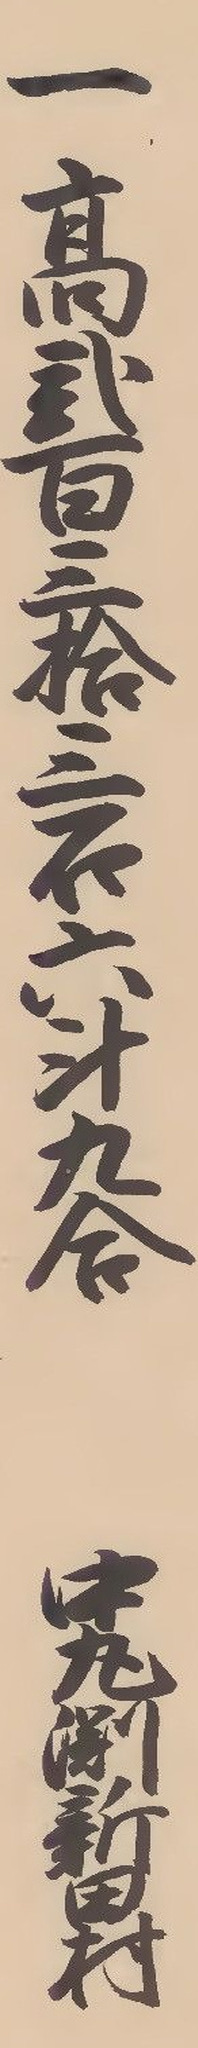一高弐百三拾三石六斗九合中丸渕新田村

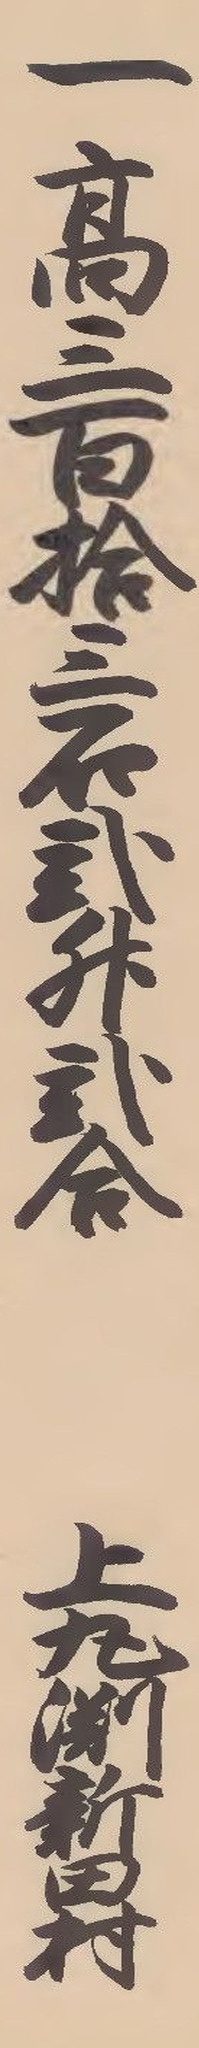一高三百拾三石弐升弐合上丸渕新田村
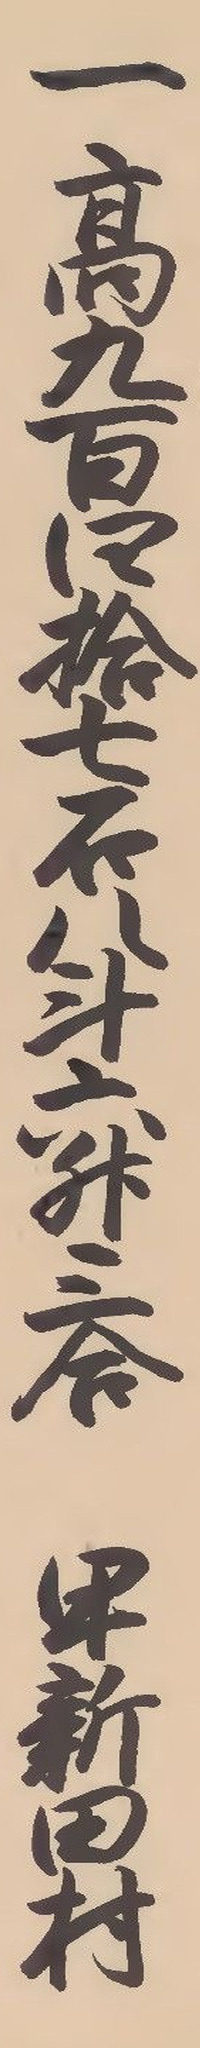一高九百四拾七石八斗六升三合甲新田村
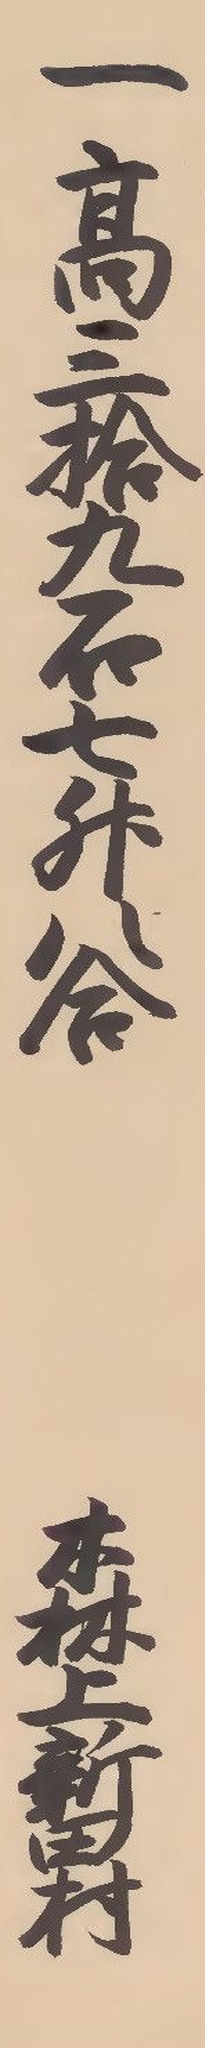一高三拾九石七升八合森上新田村
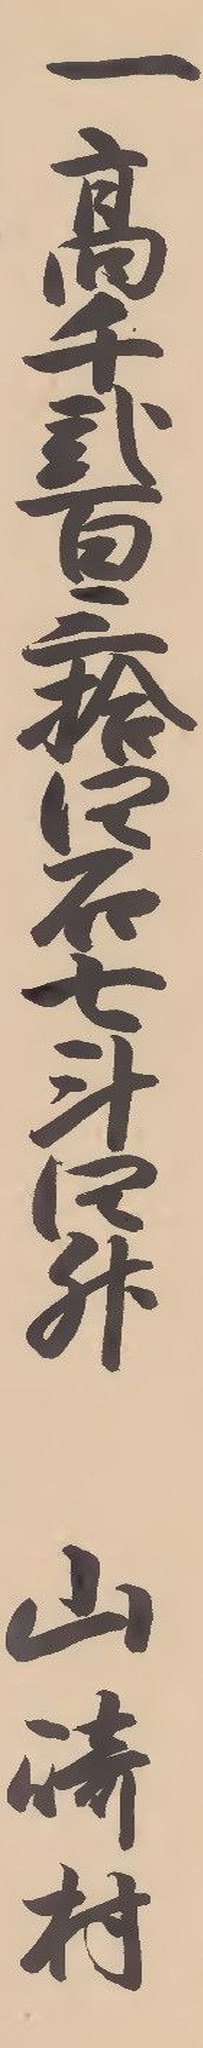一高千弐百三拾四石七斗四升山崎村
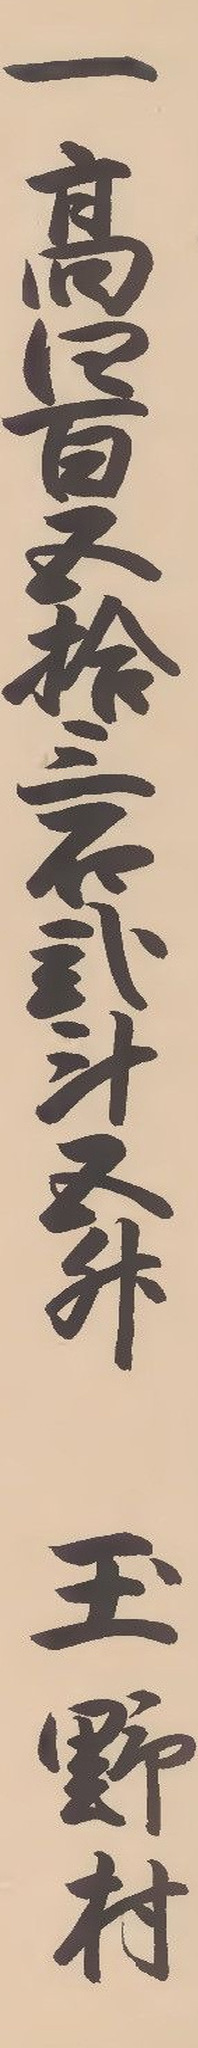一高四百五拾三石弐斗五升玉野村
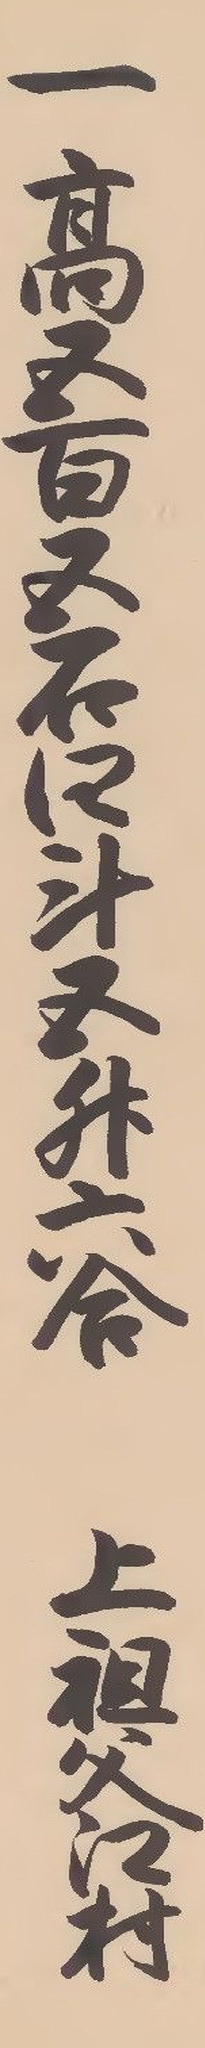一高五百五石四斗五升六合上祖父江村
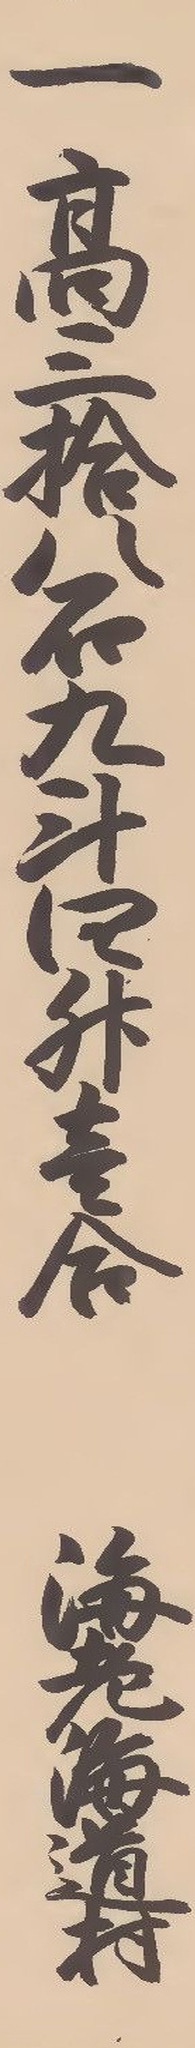一高三拾八石九斗四升壱合海老海道村
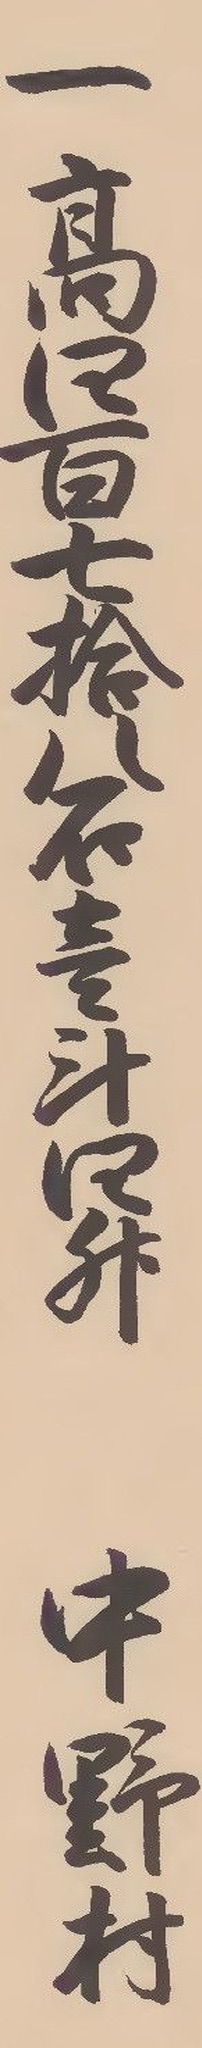一高四百七拾八石壱斗四升中野村

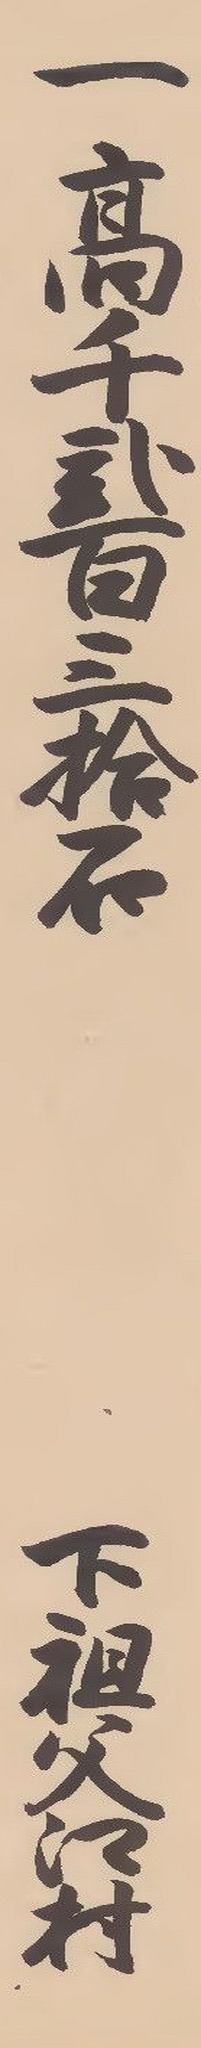一高千弐百三拾石下祖父江村
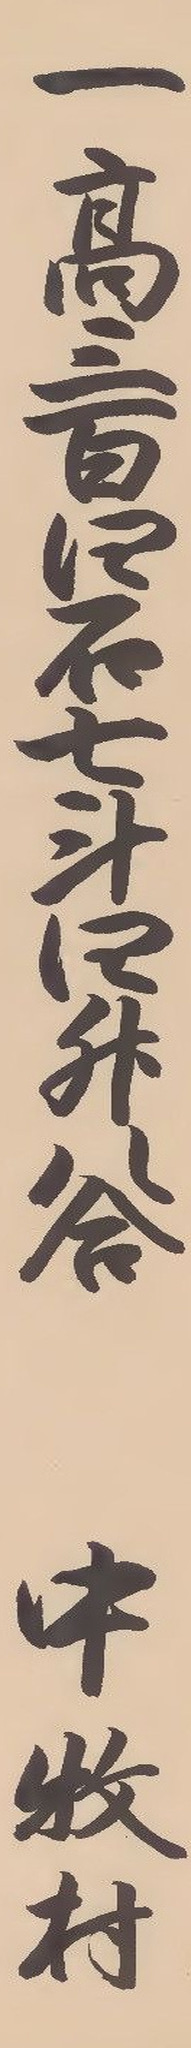一高三百四石七斗四升八合中牧村
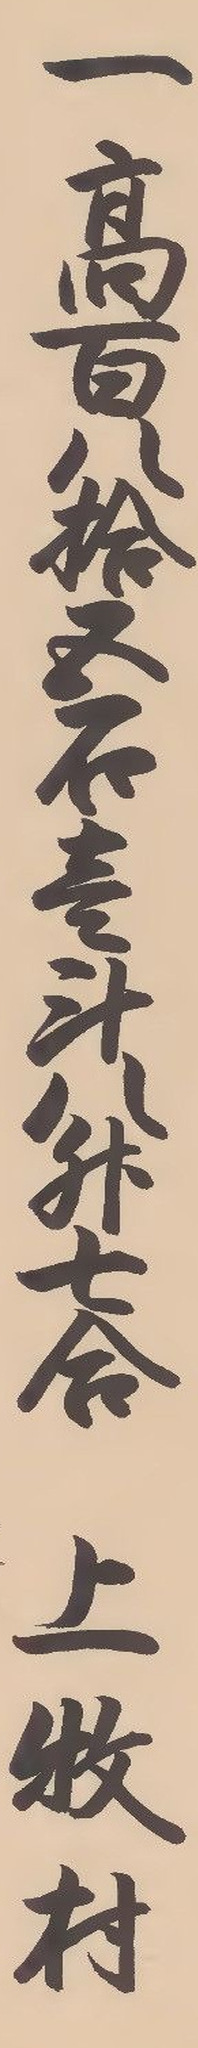一高百八拾五石壱斗八升七合上牧村
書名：尾張国郷帳
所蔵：国立公文書館 National Archives of Japan
